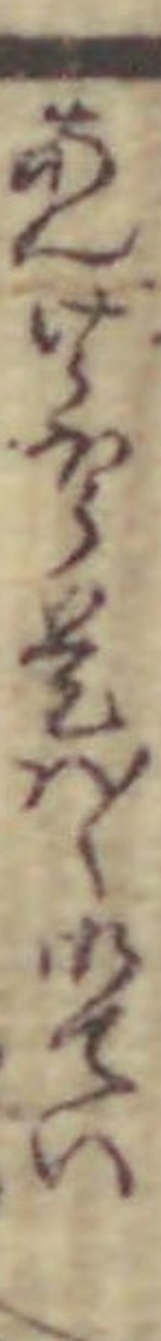あんけらほう是は〳〵御てい
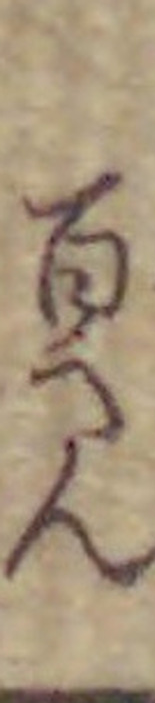百へん
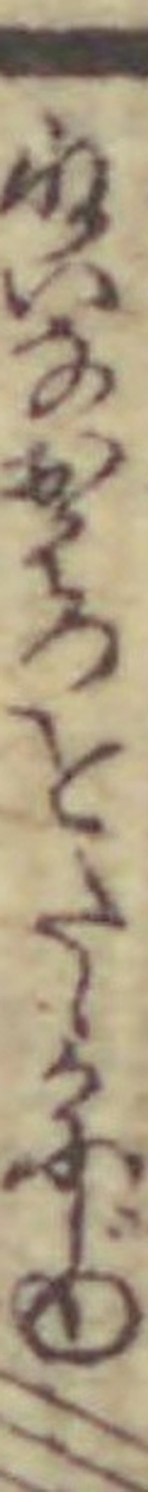ねいなおはつをたしかにじゆ
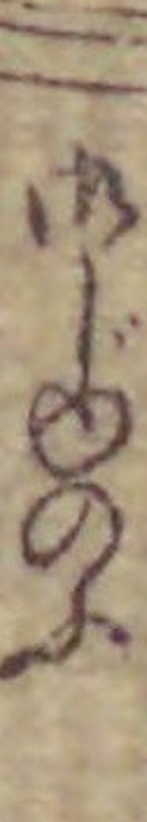御じゆのふ
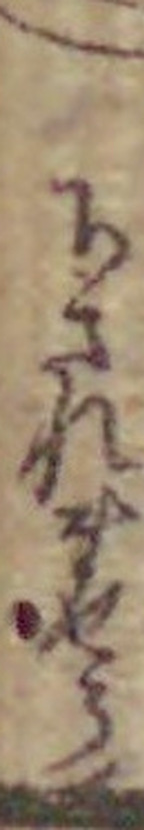下されませう

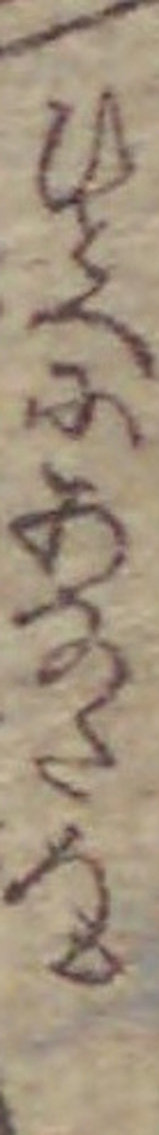ひとへにあなた様
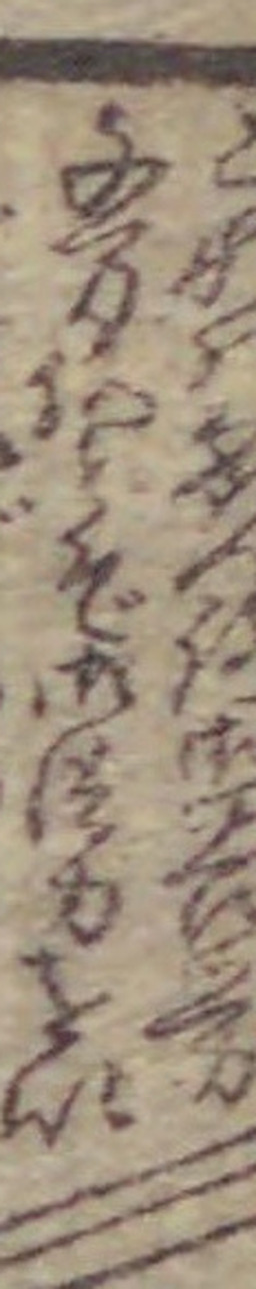子万作をぞ御法力を以て
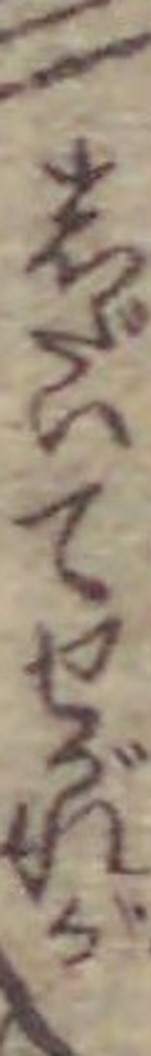しだいてせがれが
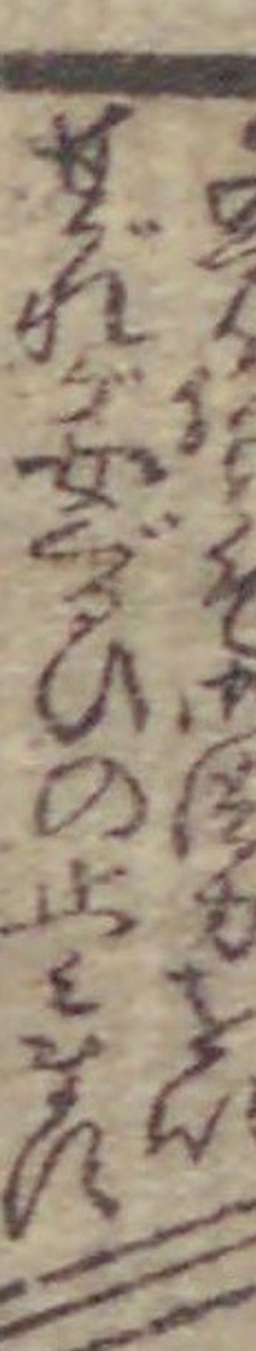せがれが女ぐるひの止みます
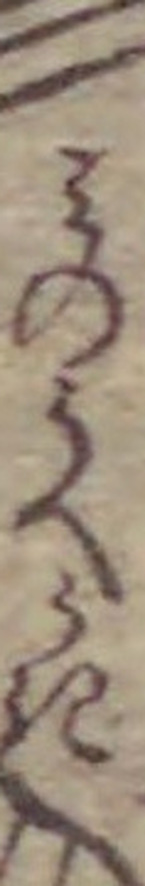みのうへうき
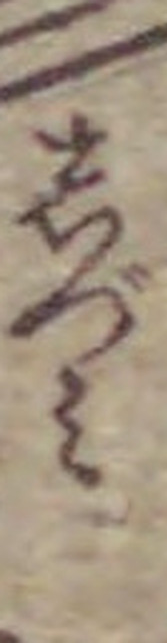しづみ
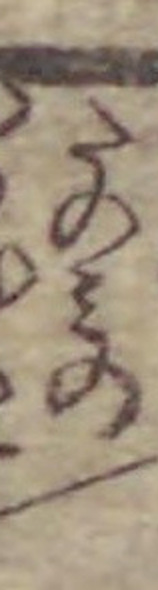たのみの
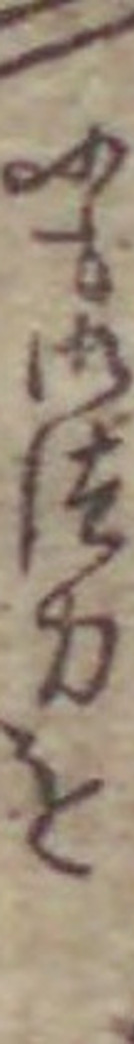にも御法力を
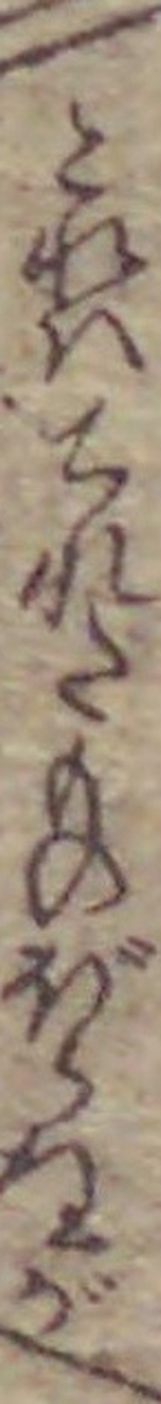これはちれたものぼう様が
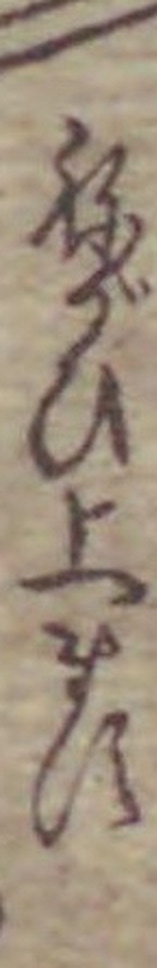ねがひ上ます
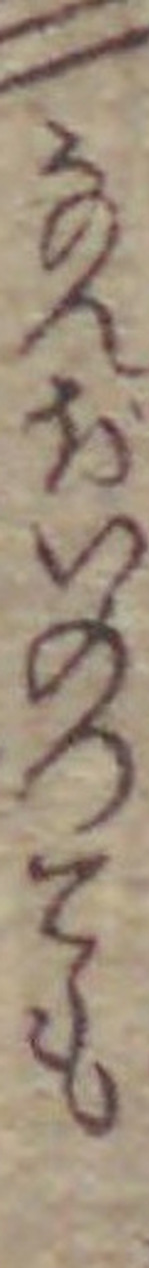なんぼいのつても
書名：止而道致虚録 3巻
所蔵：国立国会図書館 National Diet Library, JAPAN
